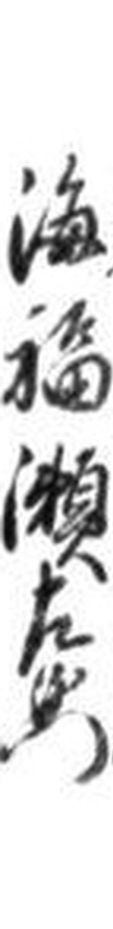海福瀬左衛門
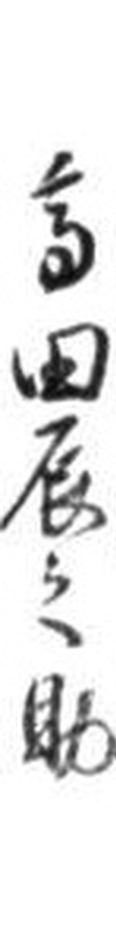高田辰之助
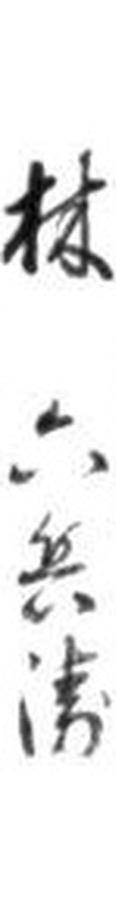林六兵衛
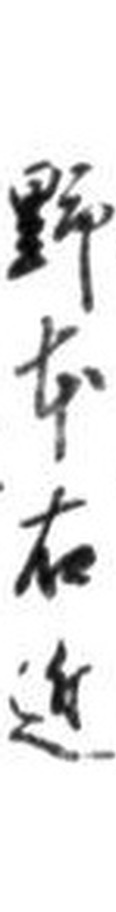野本右近
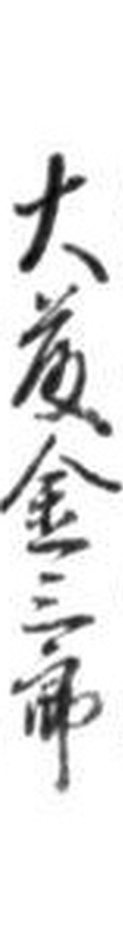大藤金三郎
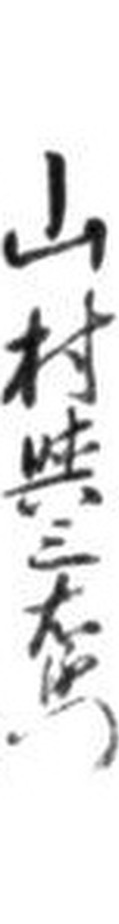山村与三右衛門
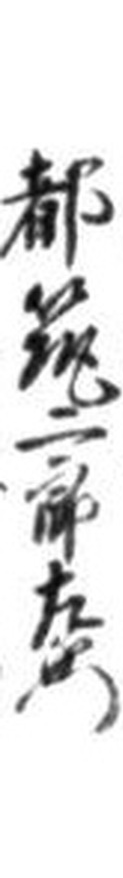都築二郎左衛門
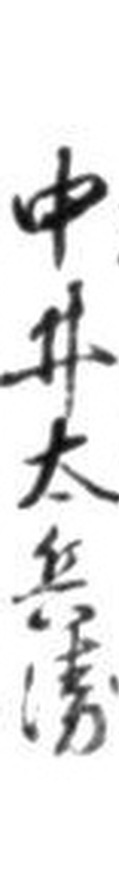中井太兵衛
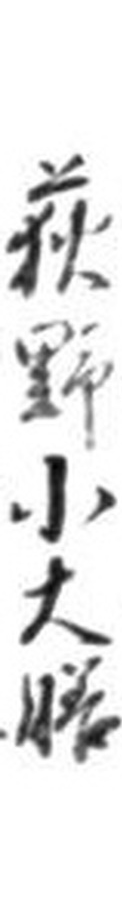荻野小大膳
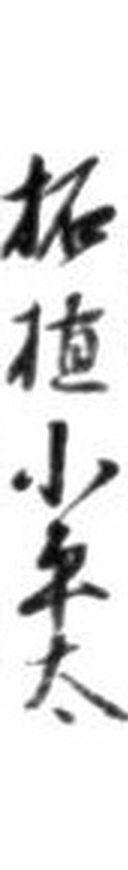柘植小平太
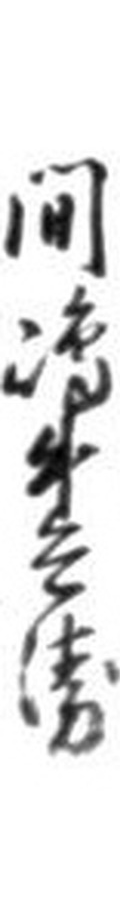間嶋牛兵衛
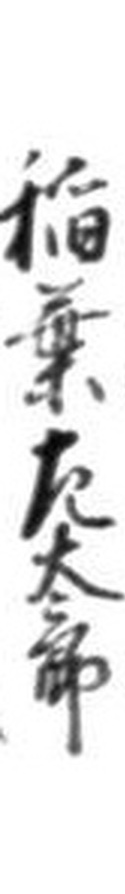稲葉左太郎
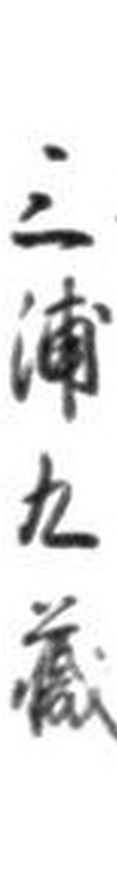三浦九蔵
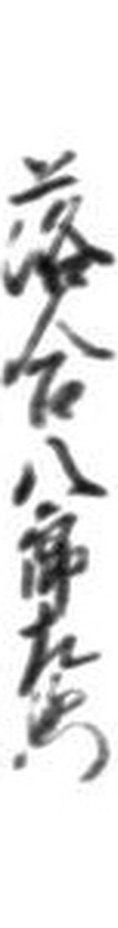落合八郎左衛門
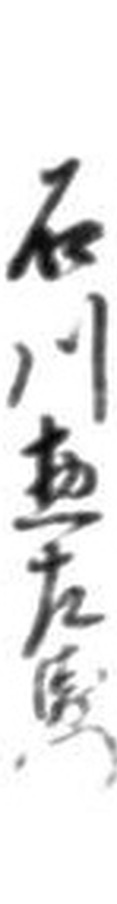石川惣左衛門
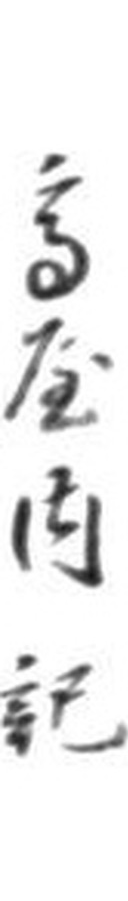高屋内記
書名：家譜 二 忠直公 従文禄四年到慶安四年
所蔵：福井県文書館 Fukui Prefectural Archives
